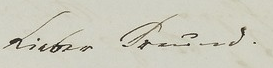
Lieber Freund.
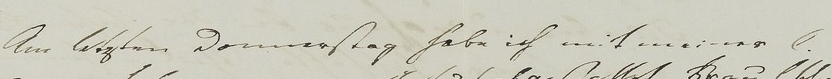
Am letzten Donnerstag habe ich mit meiner l.
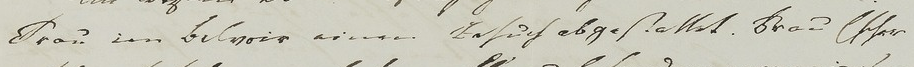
Frau im Belvoir einen Besuch abgestattet. Frau Escher
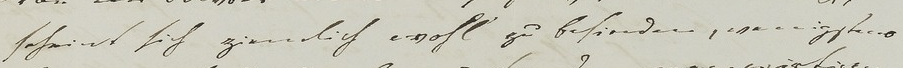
scheint sich ziemlich wohl zu befinden, wenigstens
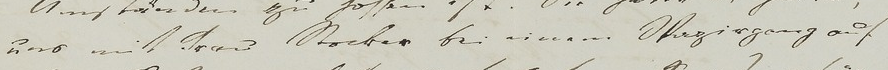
uns mit Frau Stockar bei einem Spaziergang auf
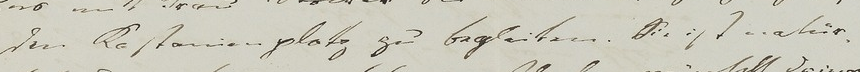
den Kastanienplatz zu begleiten. Sie ist natür-
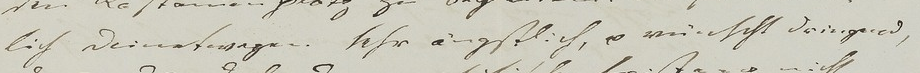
lich Deinetwegen sehr ängstlich, & wünscht dringend,
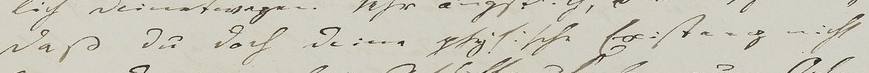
daß Du doch Deine physische Existenz nicht
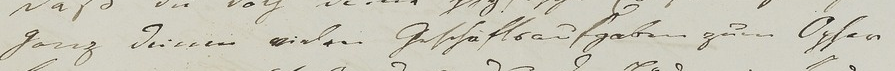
ganz Deinen vielen Geschäftsaufgaben zum Opfer
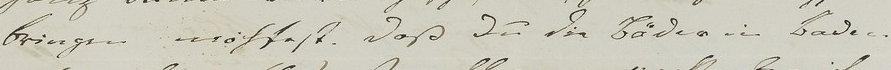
bringen möchtest. Daß Du die Bäder in Baden
